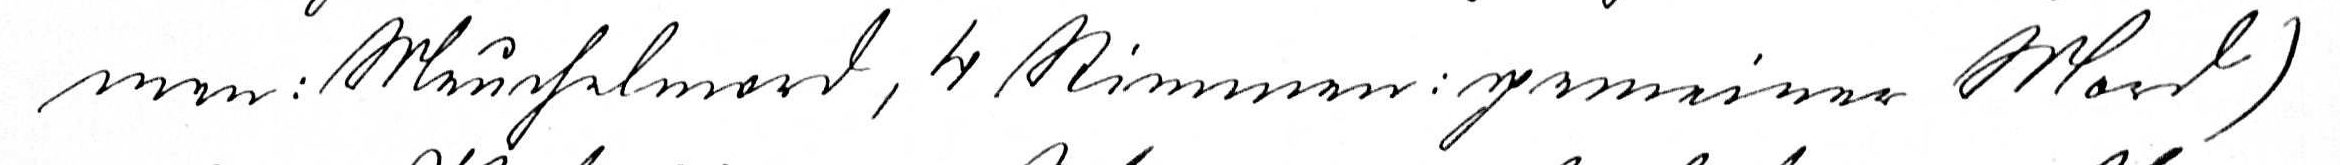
men: Meuchelmord, 4 Stimmen: gemeiner Mord)
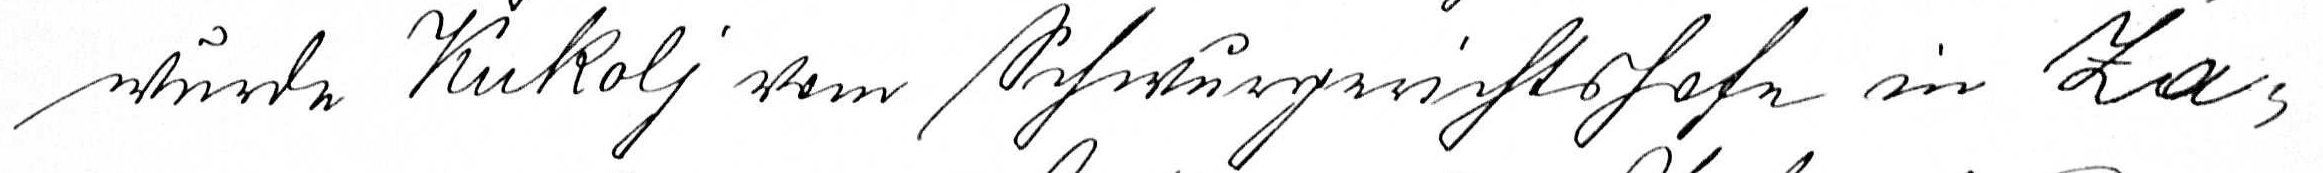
wurde Kukolj vom Schwurgerichtshofe in Za¬
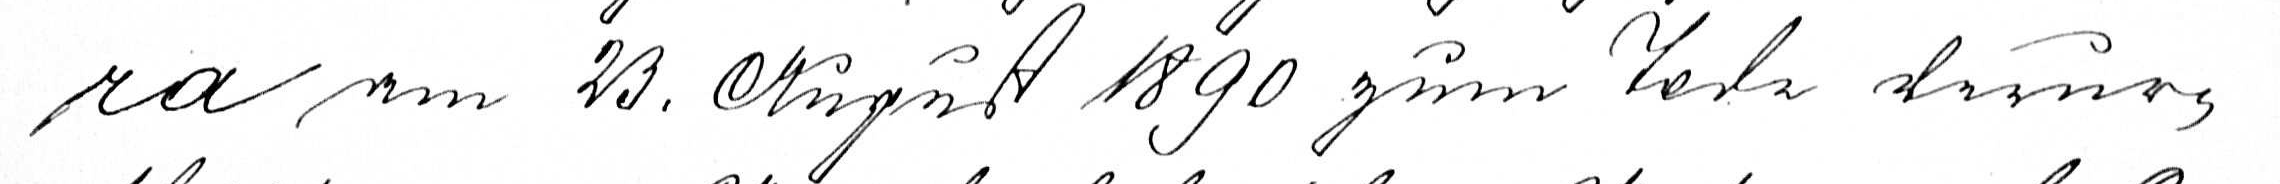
ra am 23. August 1890 zum Tode verur¬
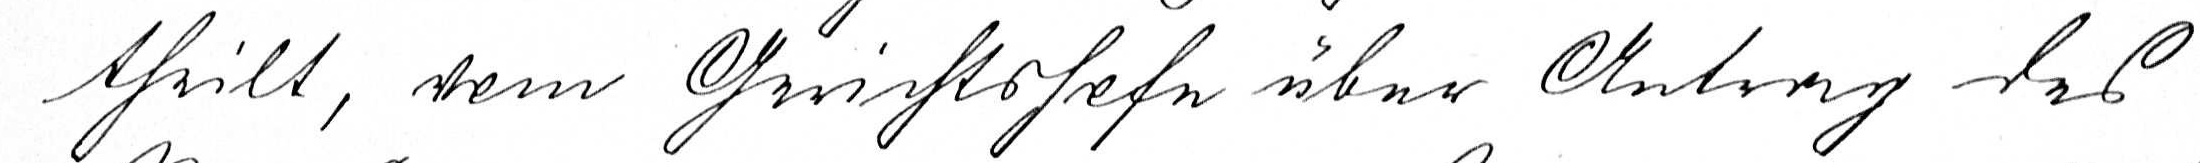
theilt, vom Gerichtshofe über Antrag des
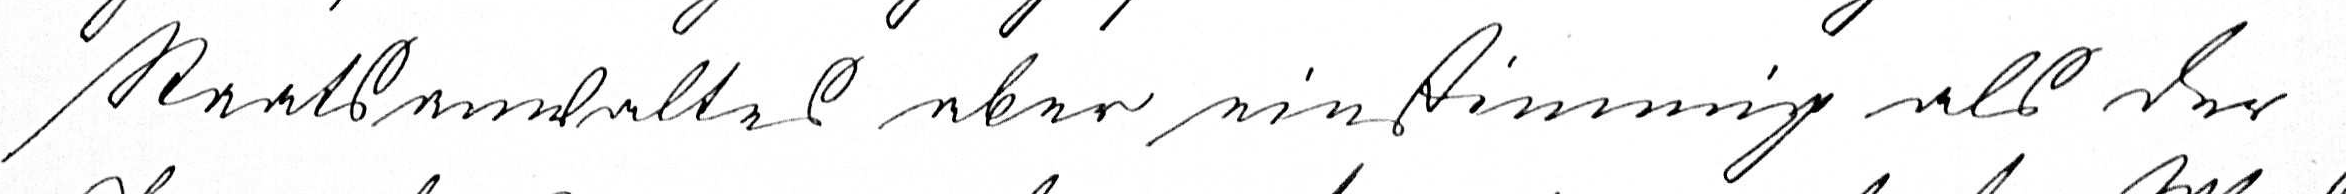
Staatsanwaltes aber einstimmig als der
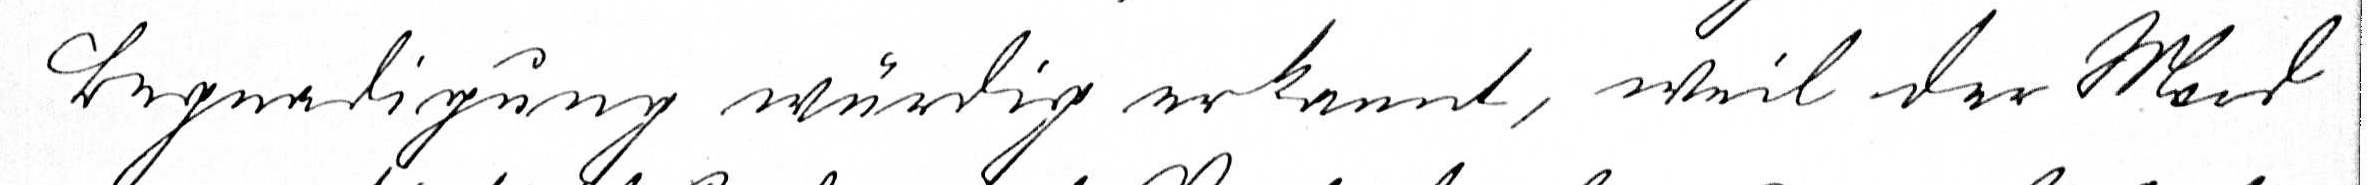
Begnadigung würdig erkannt, weil der Mord
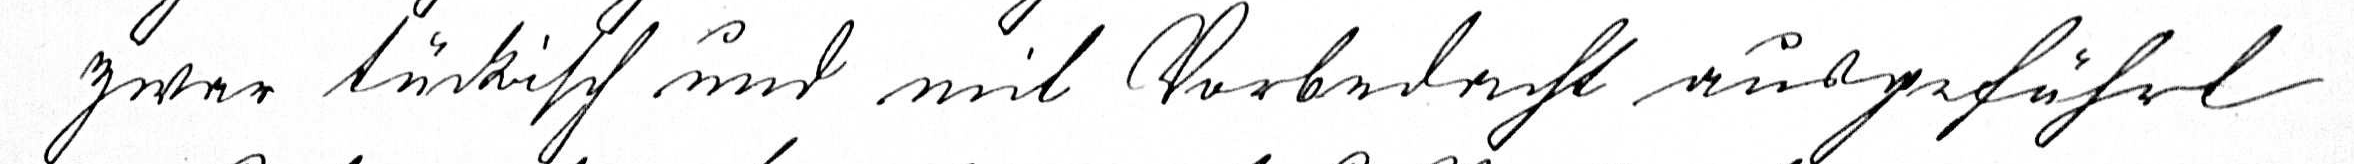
zwar tückisch und mit Vorbedacht ausgeführt
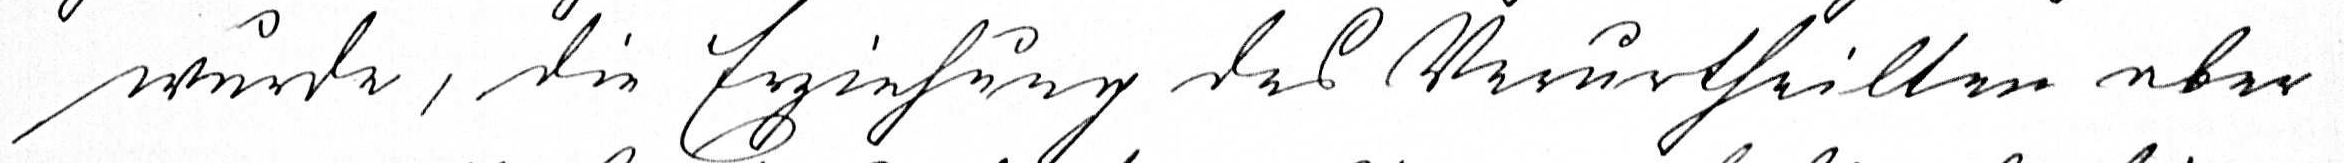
wurde, die Erziehung des Verurtheilten aber
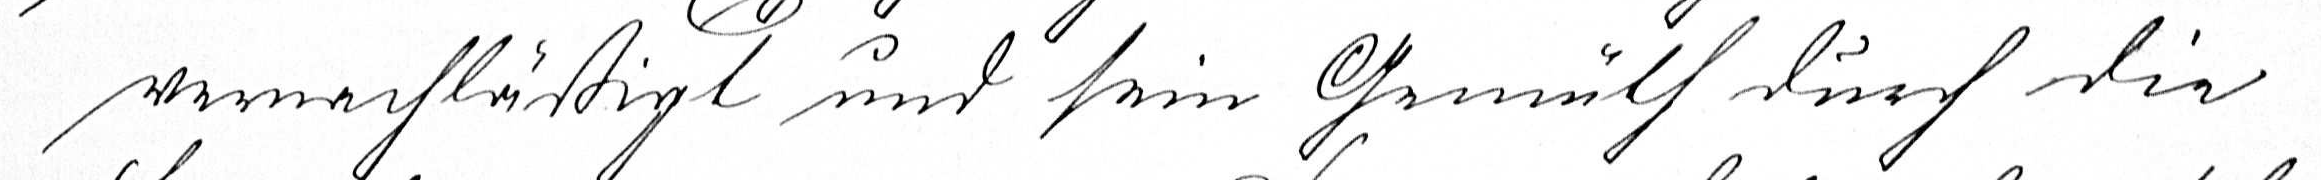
vernachläßigt und sein Gemüth durch die
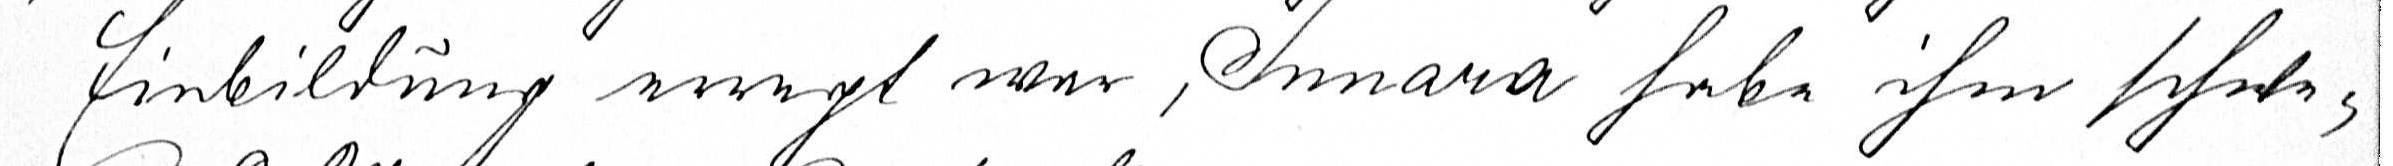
Einbildung erregt war, Sunara habe ihm schwe¬
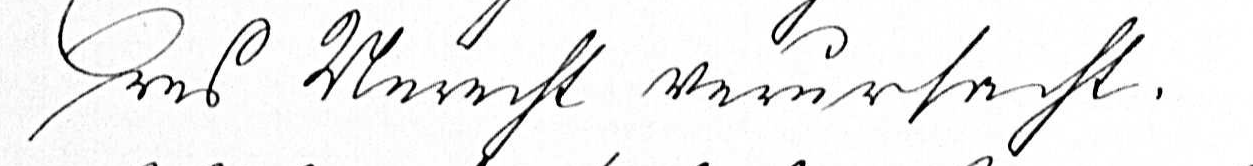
res Unrecht verursacht.
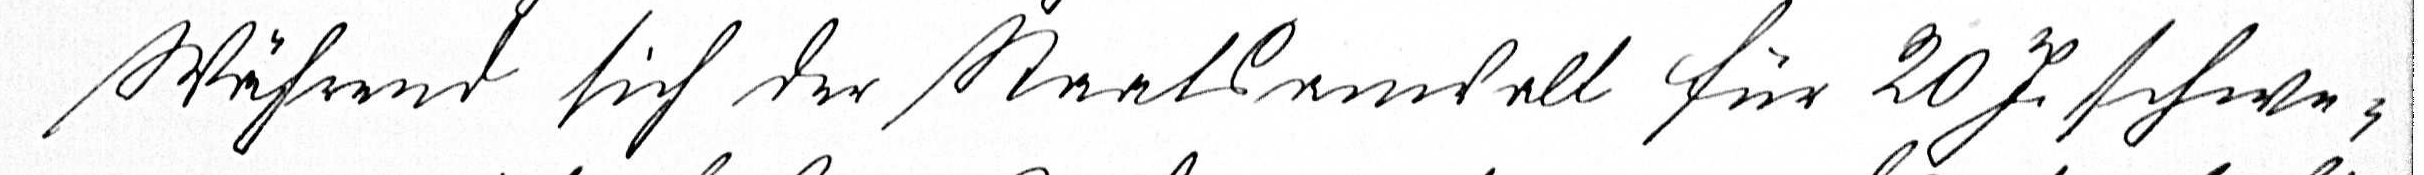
Während sich der Staatsanwalt für 20 J. schwe¬
